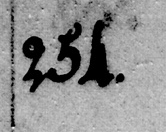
5.
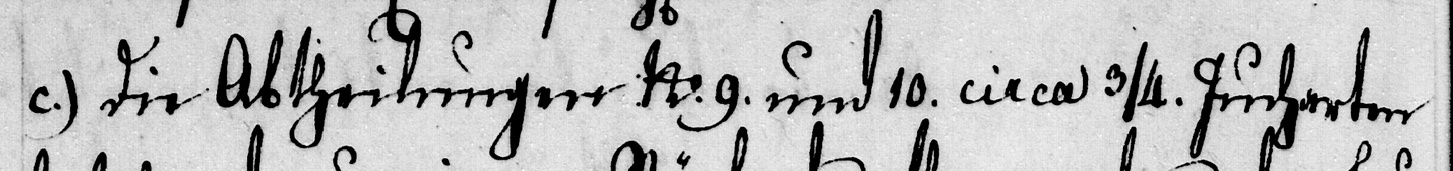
c.) Die Abtheilungen No. 9. und 10. circa 3/4. Jucharten
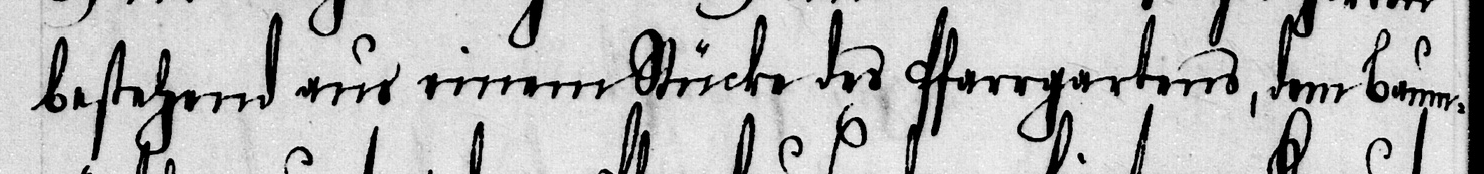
bestehend aus einem Stücke des Pfarrgartens, dem Baum¬
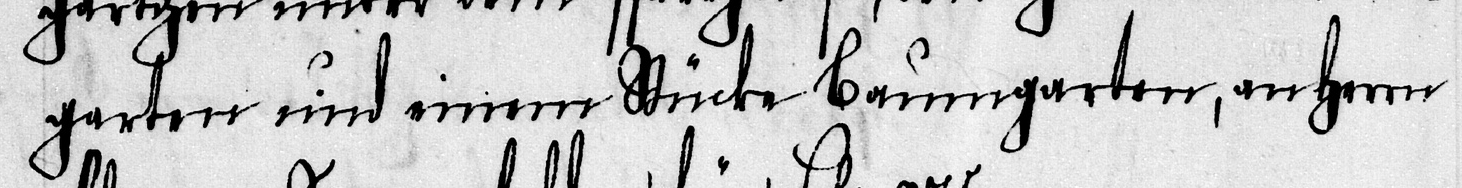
garten und einem Stücke Baumgarten, an Herrn
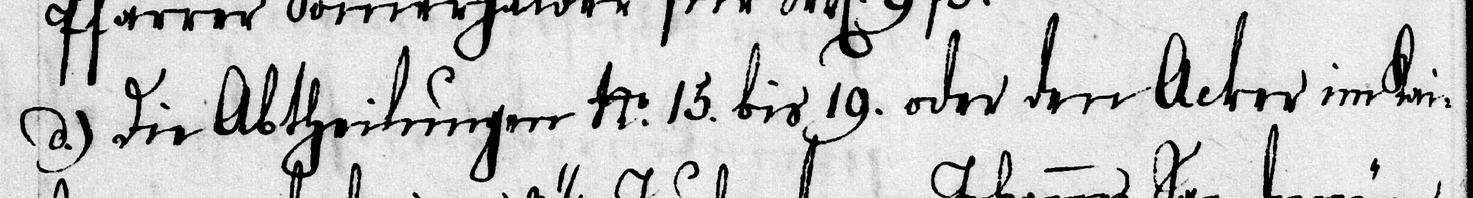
d.) Die Abtheilungen No. 15. bis 19. oder den Acker im Kai¬
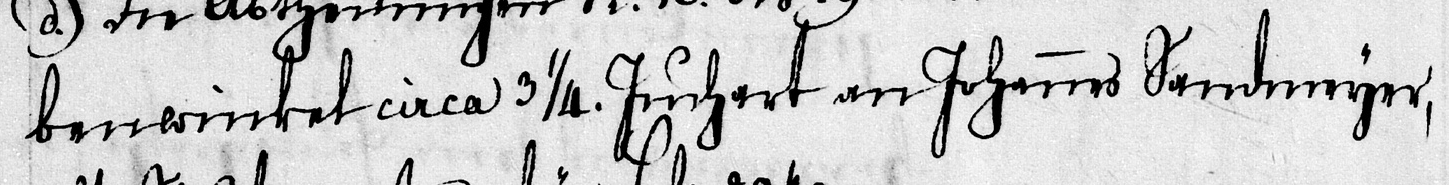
benwinkel circa 3 ¼. Juchart an Johannes Sandmeyer,
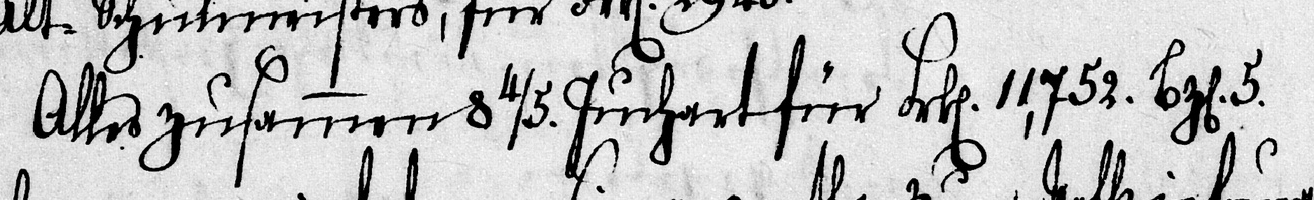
Alles zusammen 8 4/5. Juchart für Frk[en]. 11'752.
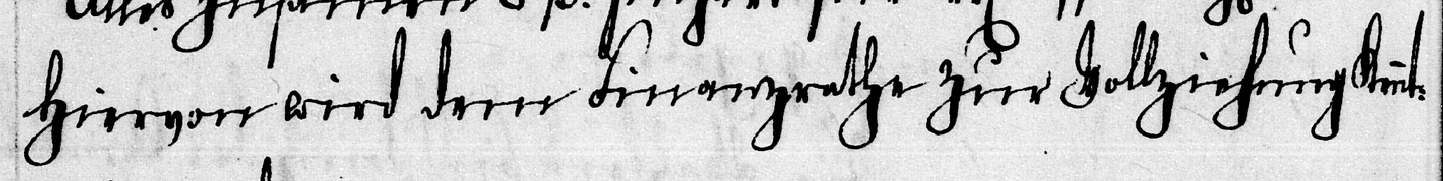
Hiervon wird dem Finanzrathe zur Vollziehung Ken¬
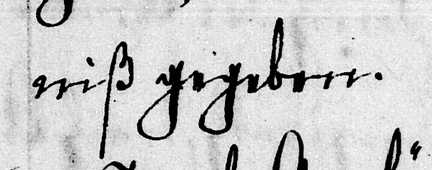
ntniß gegeben.
